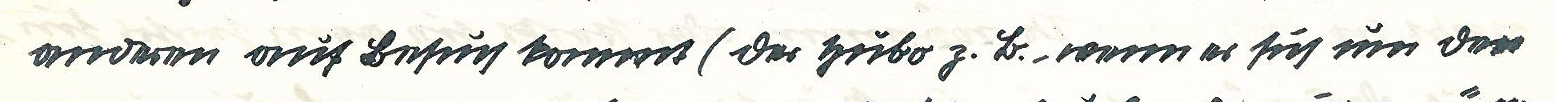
anderen auf Besuch kommt (der Hubo z.B., wenn er sich um den
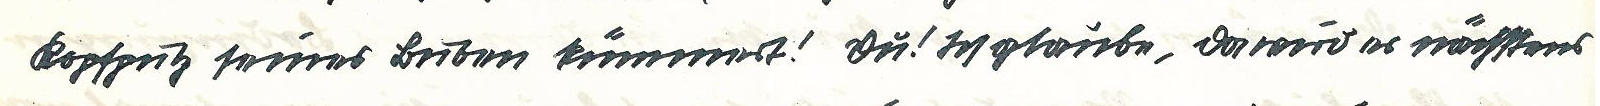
Kopfputz seines Buben kümmert! Du! Ich glaube, da wird er nächstens
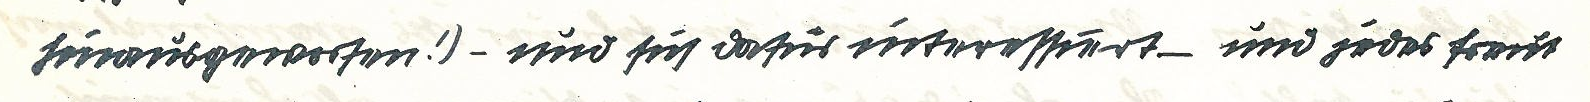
hinausgeworfen!) – und sich dafür interessiert – und jeder freut
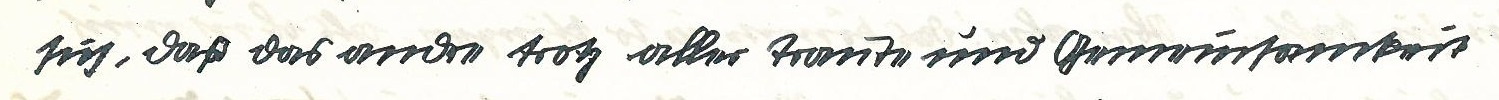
sich, daß das andre trotz allerTraute und Gemeinsamkeit
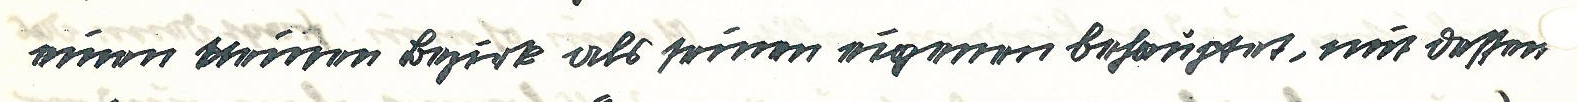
einen kleinen Bezirk als seinen eigenen behauptet, mit dessen
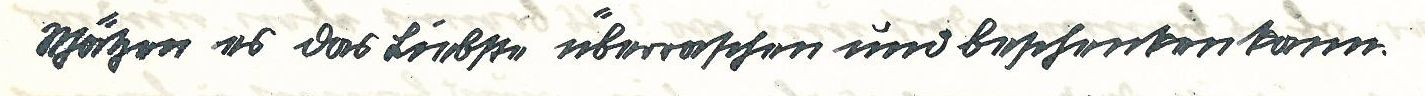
Schätzen es das Liebste überraschen und beschenken kann.
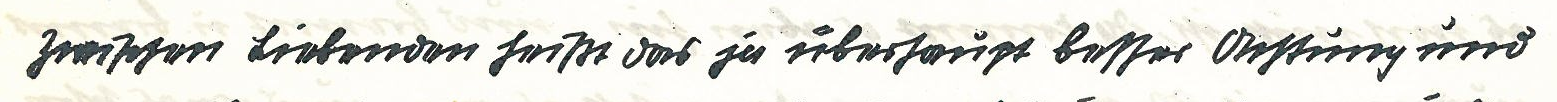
Zwischen Liebenden heißt das ja überhaupt besser Achtung und
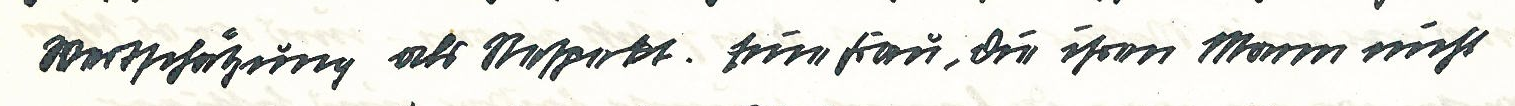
Wertschätzung als Respekt. Eine Frau, die ihren Mann nicht
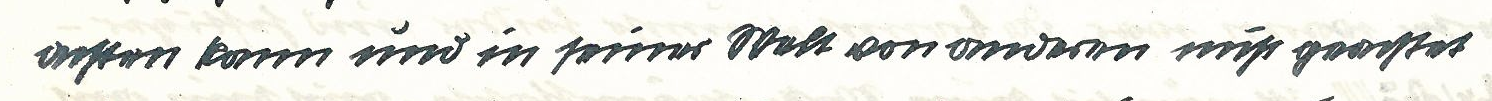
achten kann und in seiner Welt von anderen nicht geachtet
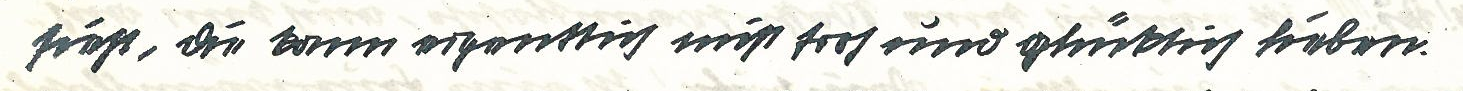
sieht, die kann eigentlich nicht froh und glücklich lieben.
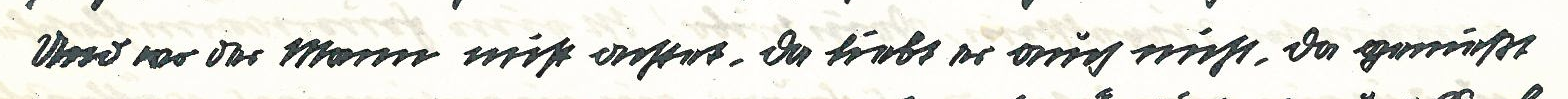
Und wo der Mann nicht achtet, da liebt er auch nicht, da genießt
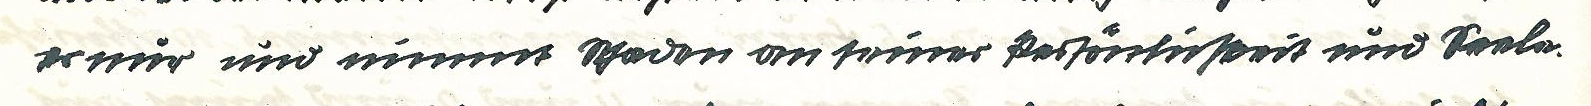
er nur und nimmt Schaden an seiner Persönlichkeit und Seele.
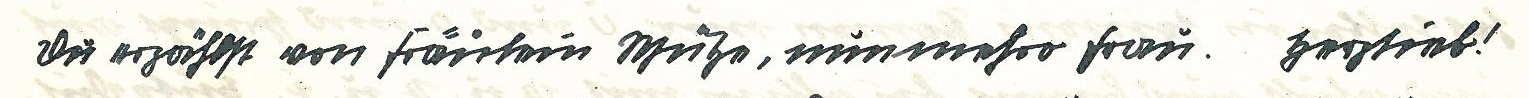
Du erzählst von Fräulein S., nunmehro Frau. Herzlieb!
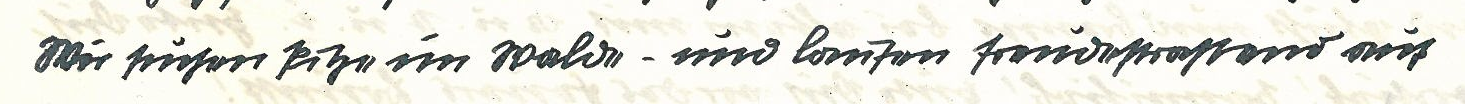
Wir suchen Pilze im Walde – und laufen freudestrahlend auf
